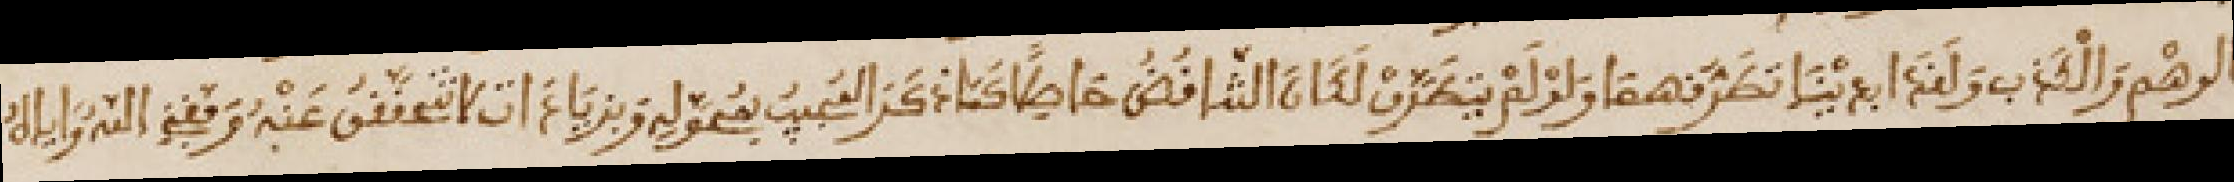الوهم والكذب ولقد ابدينا تطرقهما ولو لم يتطرق لكان التناقض حاصلا كما ذكر المجيب بمحوله وبزيادات لا تتحققو عنه وفقني الله واياه
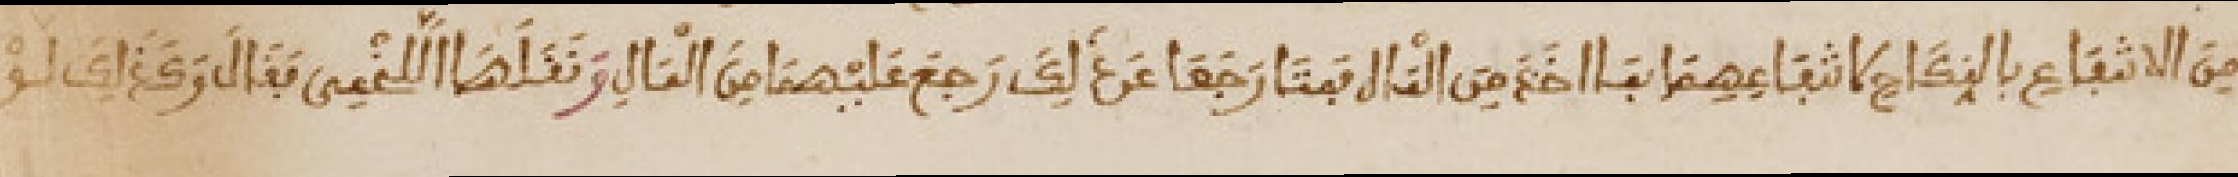من الانتفاع بالنكاح لانتفاعهما بما اخذ من المال فمتا رجعا عن ذلك رجع عليهما من المال ونقلها اللخمي فقال وكذلك لو
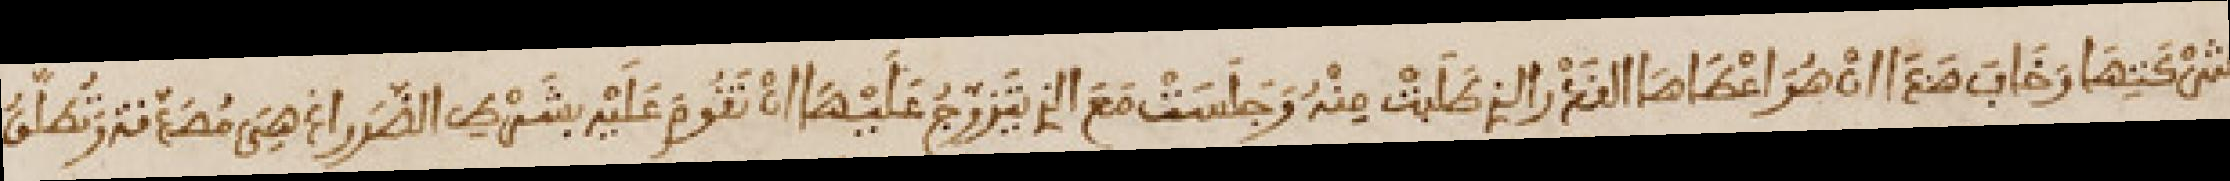شركتها وخاف هذا ان هو اعطاها القدر الذي طلبت منه وجلست مع الذي يتزوج عليها ان تقوم عليه بشرط الضرر اذ هي مصدقه وتطلق
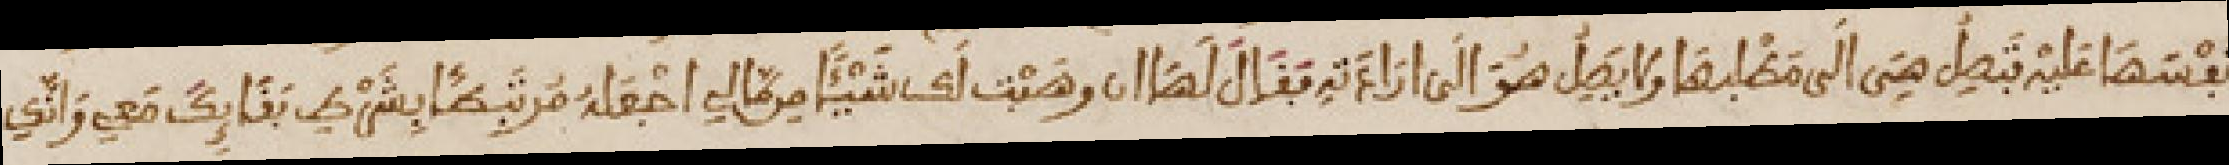نفسها عليه فتصل هي الى مطلبها ولا يصل هو الى ارادته فقال لها ان وهبت لك شيئا من مالي اجعله مرتبطا بشرط بقائك معي وانك
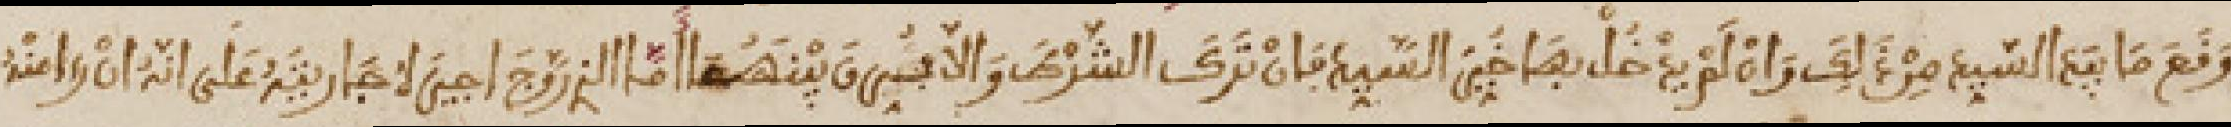وقع ما بيد السيد من ذلك وان لم يدخل بها خير السيد فان ترك الشرط والا فرق بينهما أما الذي زوج اجيره جارية على انه ان رءا منه
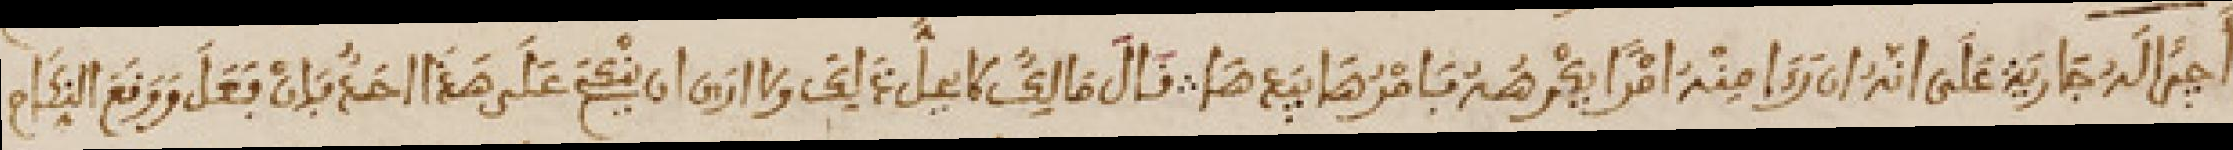أجيرا له جارية على انه ان رءا منه امرا يكرهه فامرها بيدها قال مالك لا يحل ذلك ولا ارى ان ينكح على هذا احد فان فعل ووقع النكاح
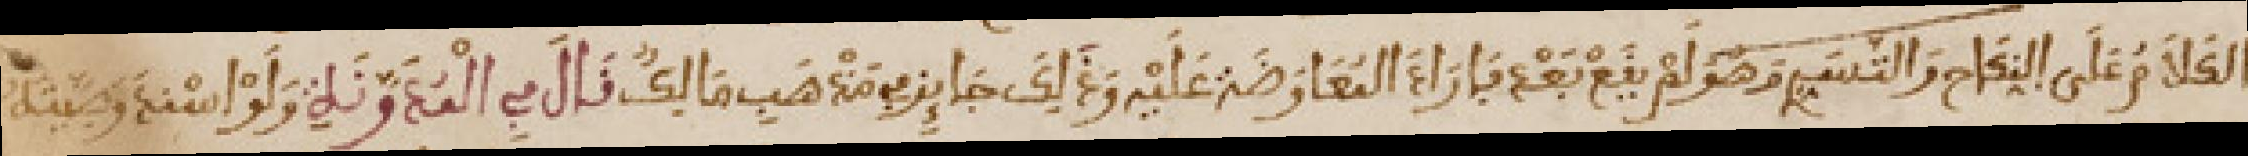الكلام على النكاح والتسري وهو لم يقع بعد فاراد المعاوضة عليه وذلك جائز في مذهب مالك قال في المدونة ولو اسند وصيته
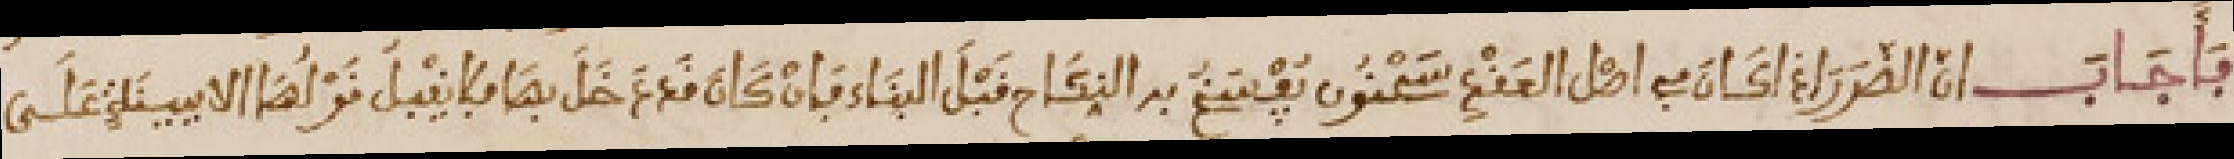فأجاب ان الضرر اذا كان في اصل العقد سحنون يفسخ به النكاح قبل البناء فان كان قد دخل بها فلا يقبل قولها الا ببينة على
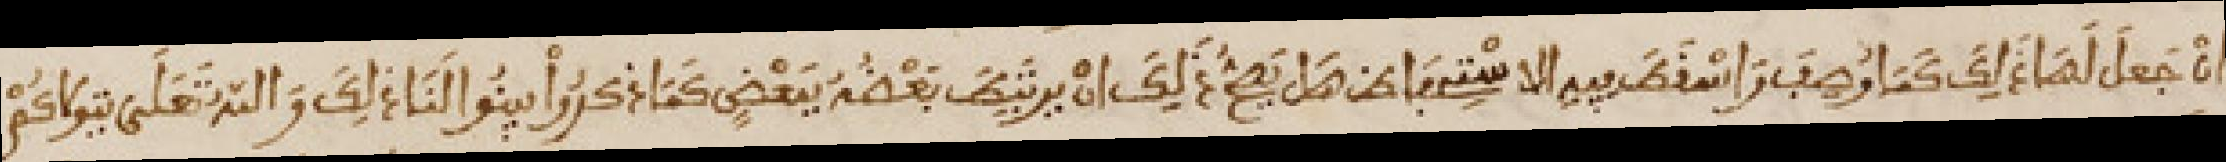ان جعل لها ذلك كما وصف واسقط فيه الاستحفاظ هل يصح ذلك ان يرتبط بعضه ببعض كما ذكروا بينوا لنا ذلك و الله تعالى يتولاكم
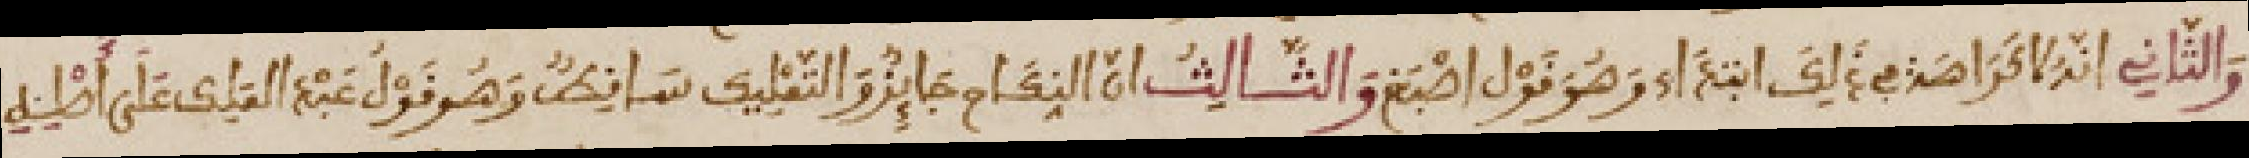والثاني انه لا كراهة في ذلك ابتداء وهو قول اصبغ والثالث ان النكاح جائز والتمليك ساقط وهو قول عبد الملك على أصله
